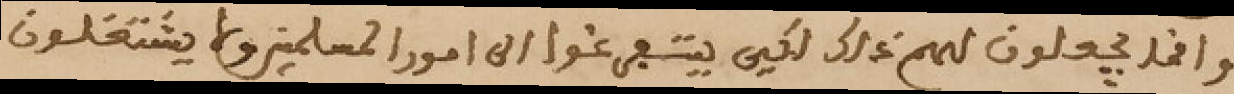وانما يجعلون لهم ذلك لكي يتفرغوا الى امور المسلمين ولا يشتغلون
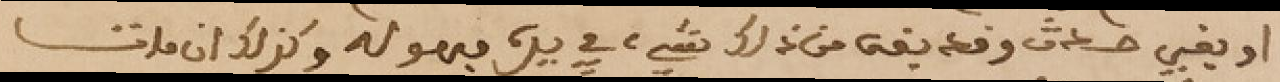او بغير حدث وقد بقي من ذلك شيء في يده فهو له وكذلك ان مات
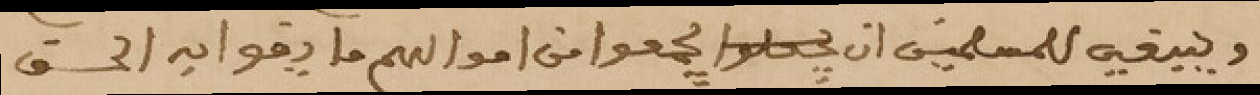وينبغي للمسلمين ان يجمعوا من اموالهم ما يقوا به الحق
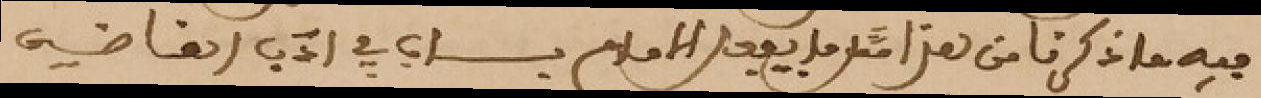فيه ما ذكرنا من هذا مثل ما يفعل الامام باب في ادب القاضي
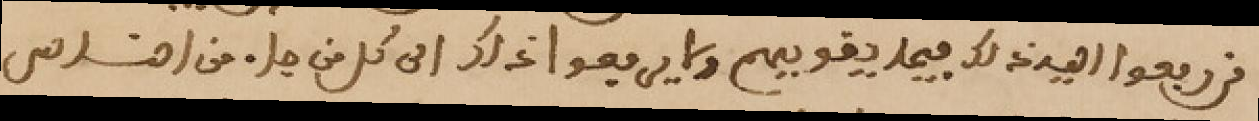من رفعوا اليه ذلك فيما يقويهم ولا يرفعوا ذلك الى كل من جاء من الناس
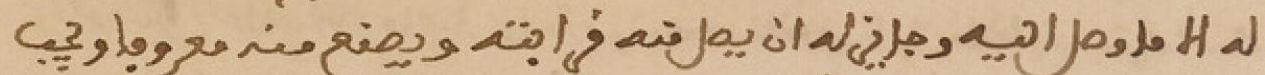له الا ما وصل اليه وجايز له ان يصل منه قرابته ويصنع منه معروفا ويجب
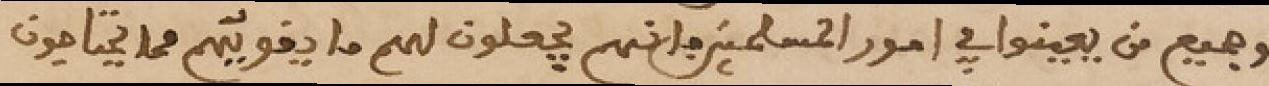وجميع من يعينوا في امور المسلمين فانهم يجعلون لهم ما يقويهم مما يحتاجون
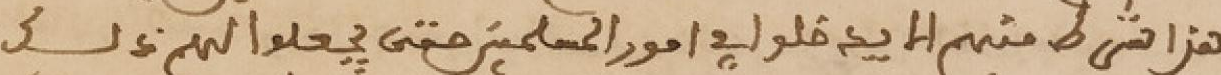هذا شرط منهم لا يدخلوا في امور المسلمين حتى يجعلوا لهم ذلك
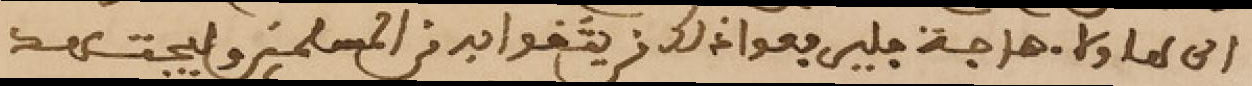الى لها ولا حاجة فليرفعوا ذلك من يثقوا به من المسلمين وليجتهد
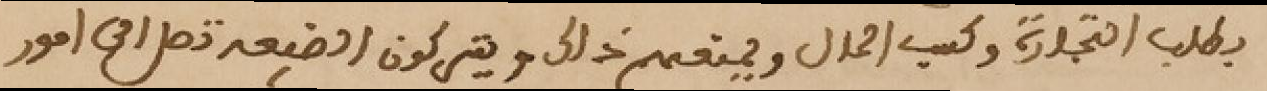بطلب التجارة وكسب المال ويمنعهم ذلك ويتركون الضعية تصل الى امور
